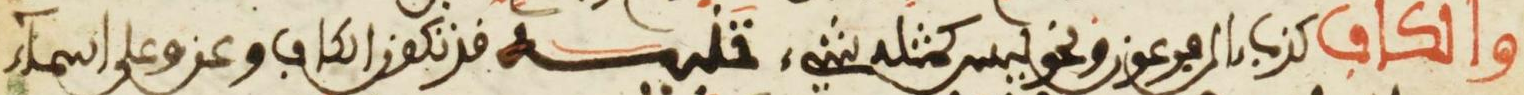و الكاف كذب الى الفرعون و نحو ليس كمثله شيء تنبيه قد تكون الكاف و عن و على اسماء
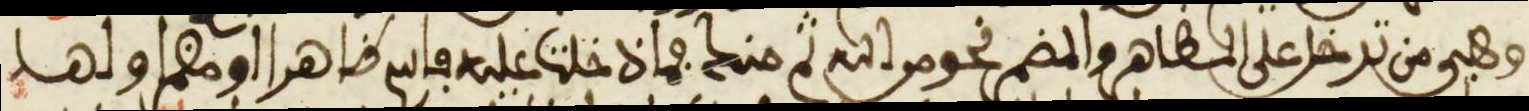و# من تدخل على الظاهر والمضمر نحو من الله ثم منك فماض خلت عليه فاسم ظاهرا او مضمرا و لها
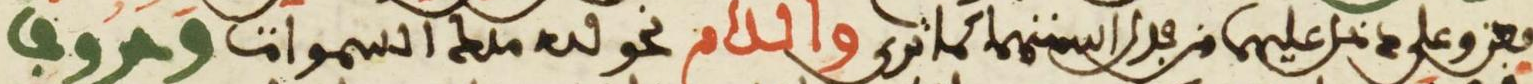فعن و على دخل عليهما من فدل اسمتهما كما ترى و اللام نحو لله ملك السموات و حروف
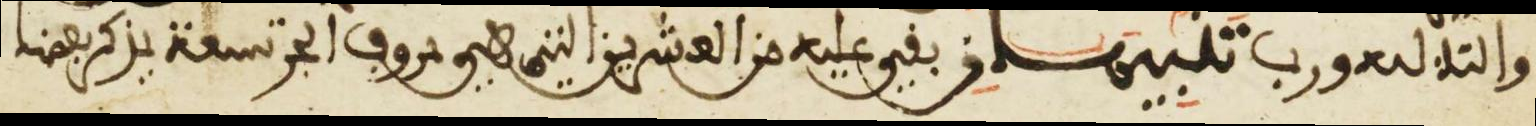والتاء لله ورب تنبيهان بقي عليه من العشرين التي هي حروف الجر تسعة يذكر بعضا
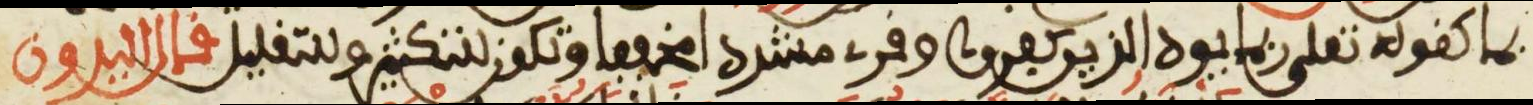بما كقوله تعلى وبما يود الذين كفروا وقرء مشددا مخففا و تكون للتكثير و للتقليل قال اليدون
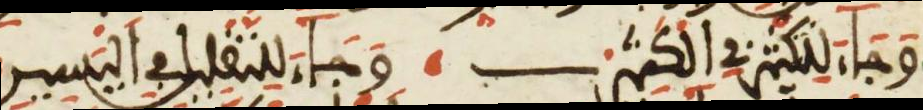و جاء للكثير في الكثير - و جاء للتقليل في اليسير
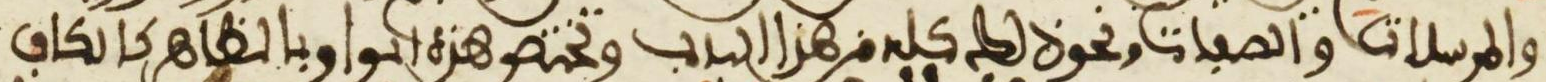والمرسلات و الصفات و نحو ذلك كله من هذا الباب و تختص هذه الواو بالظاهر كالكاف
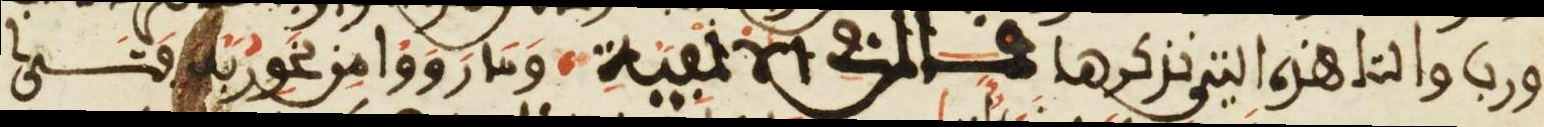و رب والتا هذه التي نذكرها قال في الالفية و ما روؤا من نحو وب# فتى
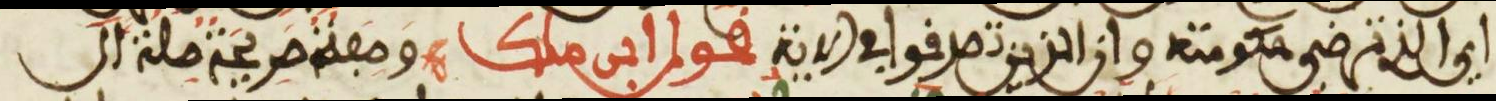أي ال# ترضى حكومته و ان الذين تصدقوا في الاية ضول اج ملك وصفة صريحة صلة ال
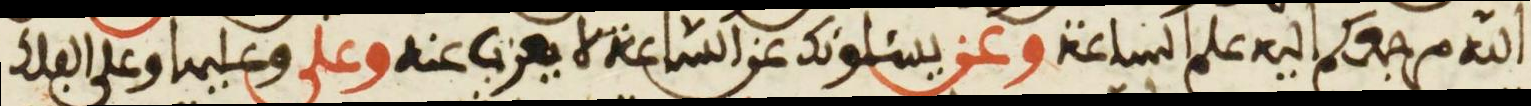الله مرجعكم اليه علم الساعة وعن يسئلونك عن الساعة لا يعرف عنه و على و عليها و على الفلك
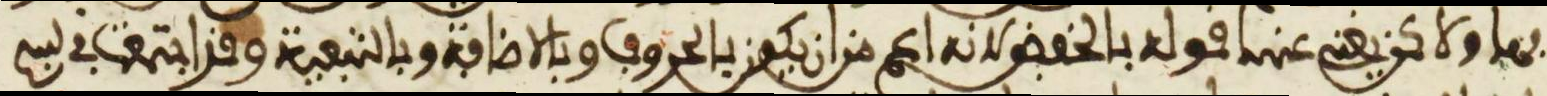بها ولاكن يغنى عنهما قوله بالخفض لانه اعم من ان يكون بالحروف و بالإضافة و بالتبعية و قد اجتمعت في بسم
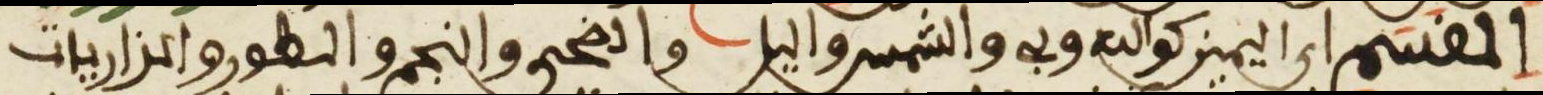القسم أي اليمين كوالله و بي والشمس و اليل و الضحى و النجم و المطور و الذاريات
